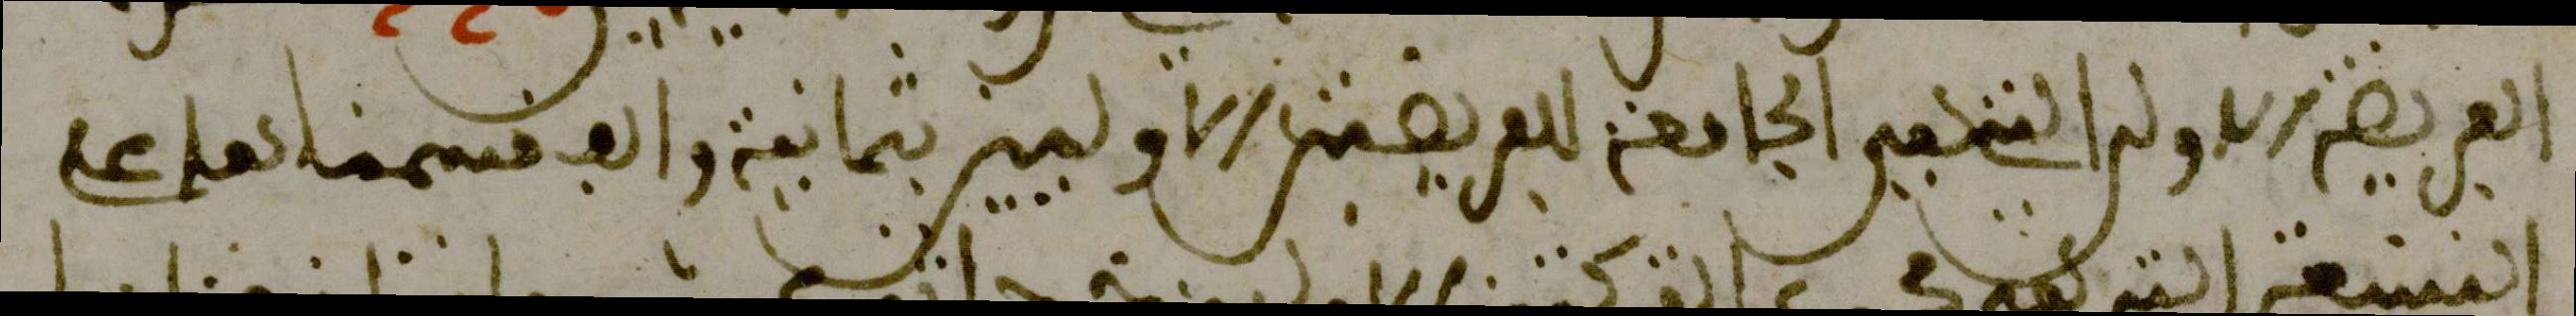الفريضة الاولى التي هي الجامعة للفريضتين الاوليين ثمانية والف قسمناها على
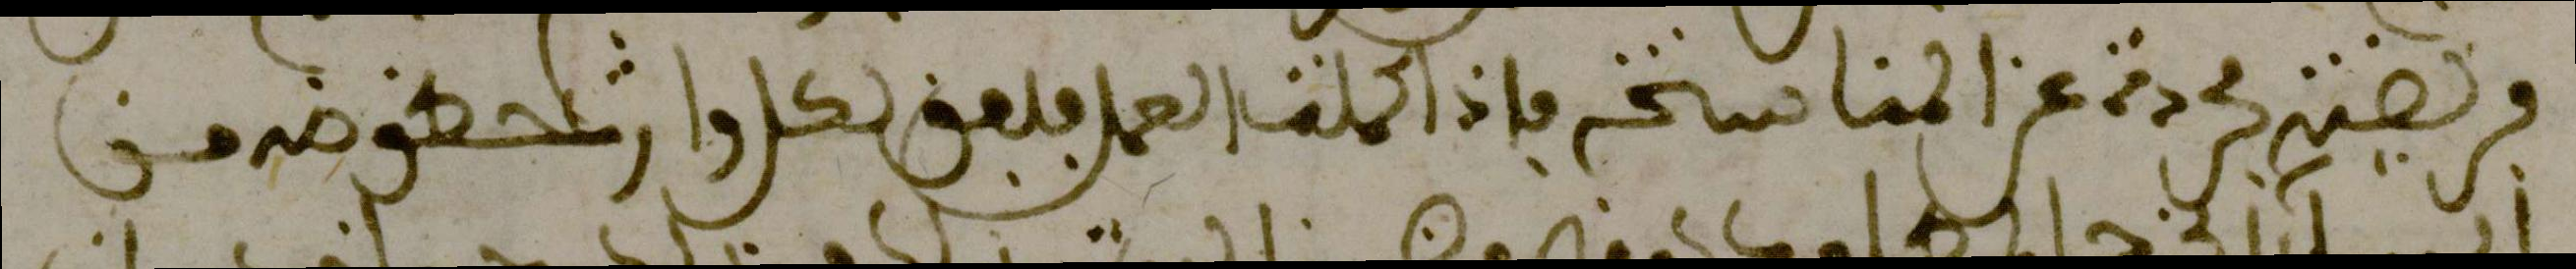فريضة مجردة عن المناسخته فاذا كملت العمل فلفق لكل وارث حظوضة من
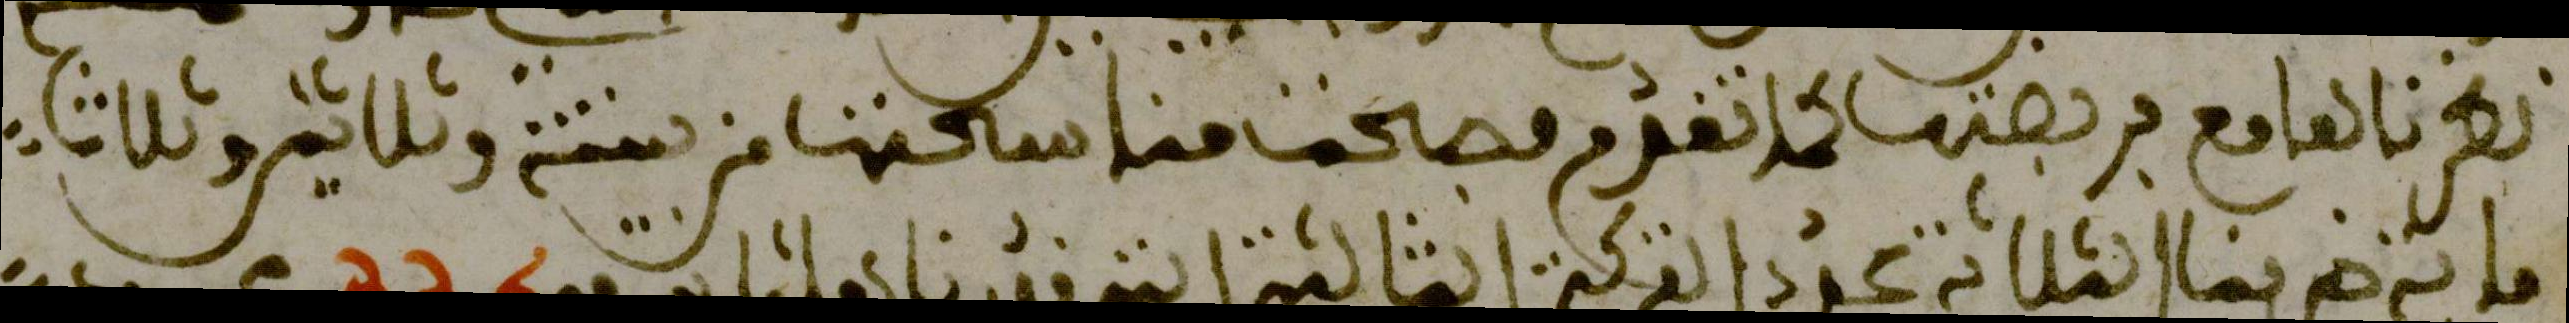نظرناها مع فريضتها كما تقدم فصحت منا سحتها من ستة وثلاثين وثلاث
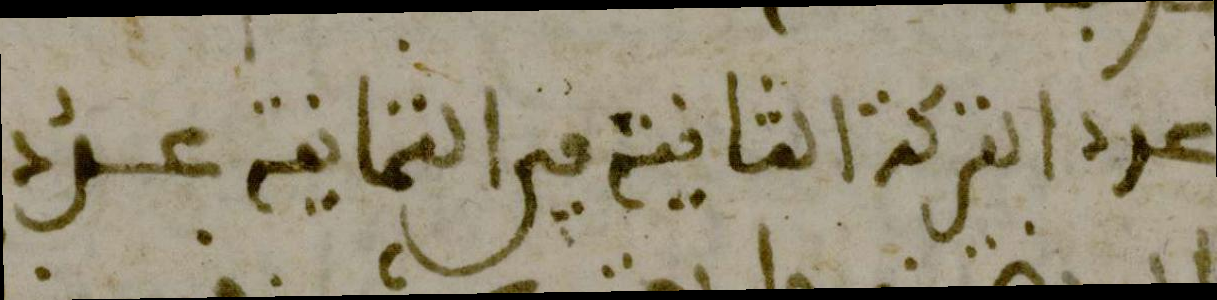عدد التركة الثانية في الثمانية عدد
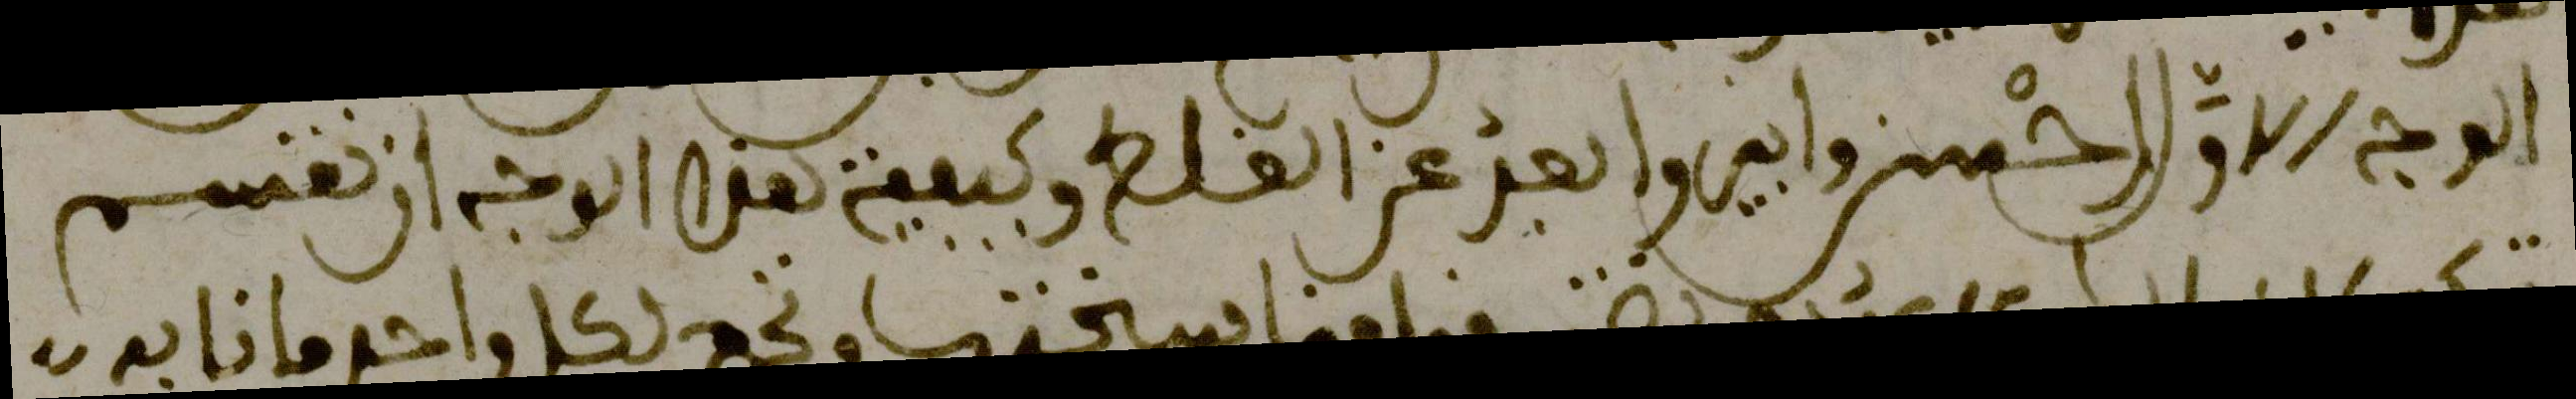الوجه الاوّل احْسن وابين وابعد عن الغلط وكيفية هذا الوجه ان تقسم
